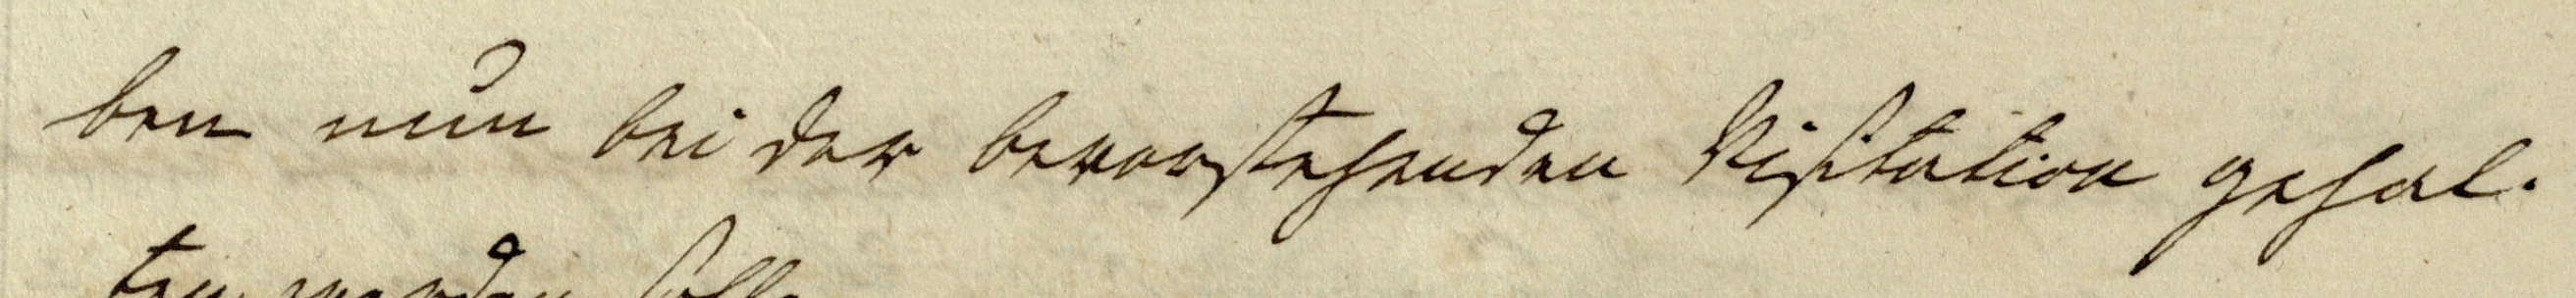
ben nun bei der bevorstehenden Visitation gehal¬
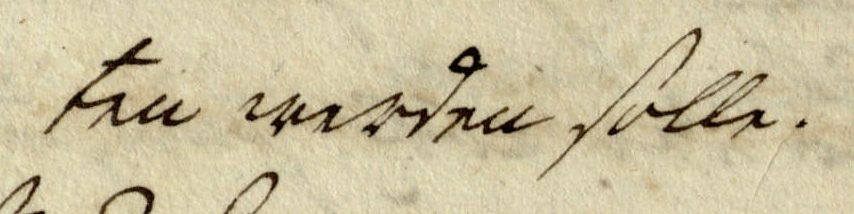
ten werden solle.
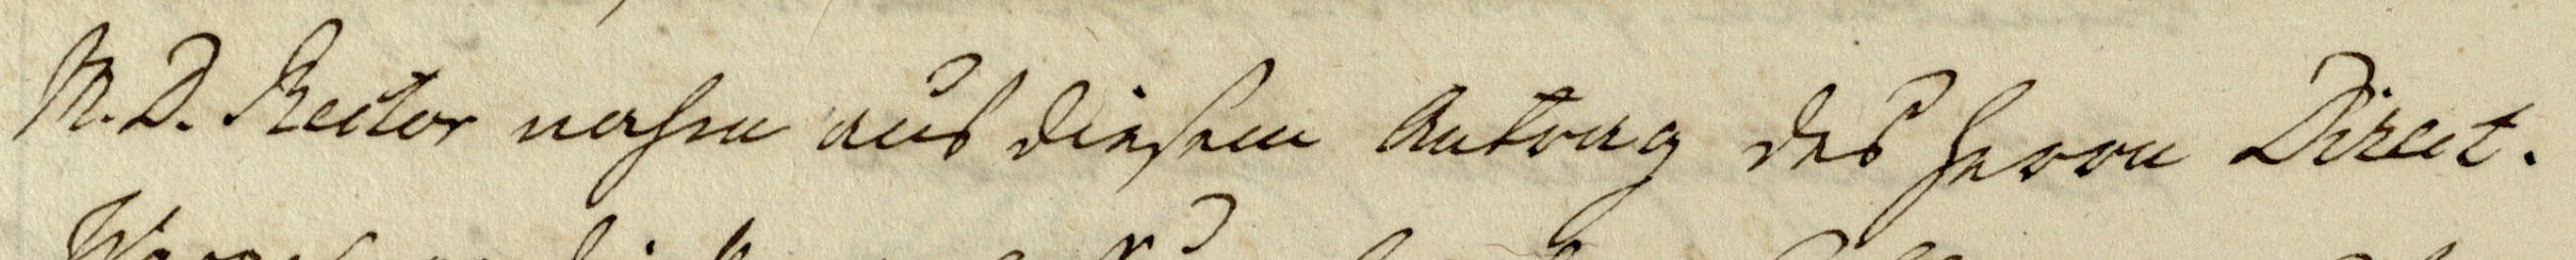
M. D. Rector nahm aus diesem Antrag des Herrn Direct.
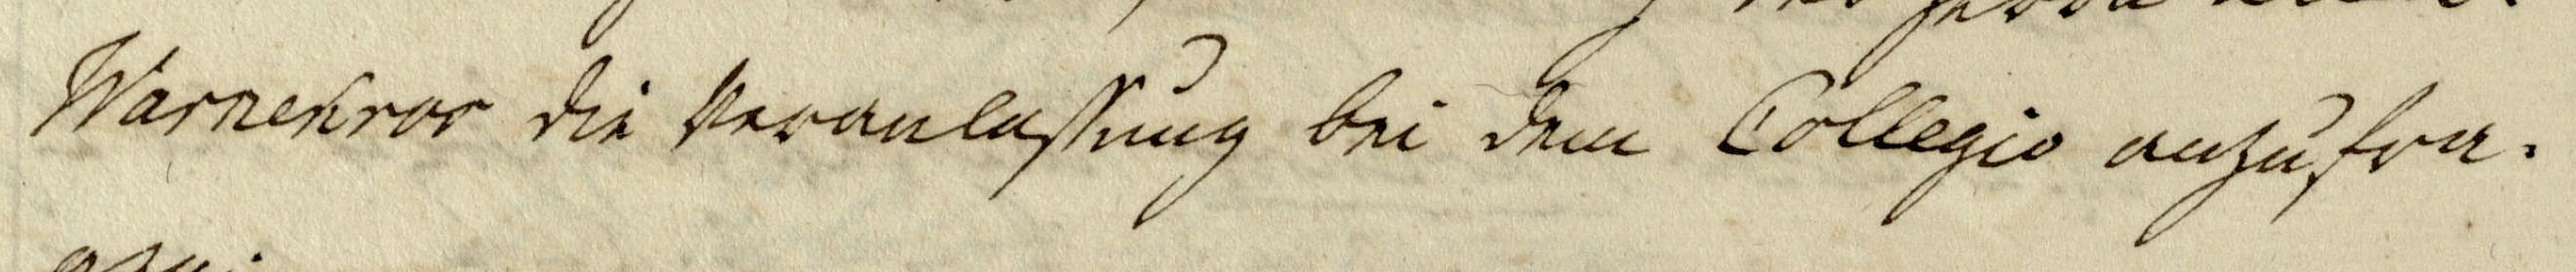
Warnekros die Veranlassung bei dem Collegio anzufra¬
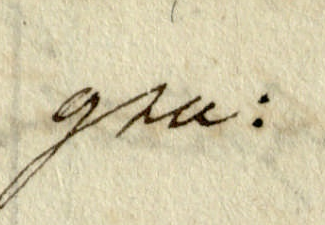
gen:
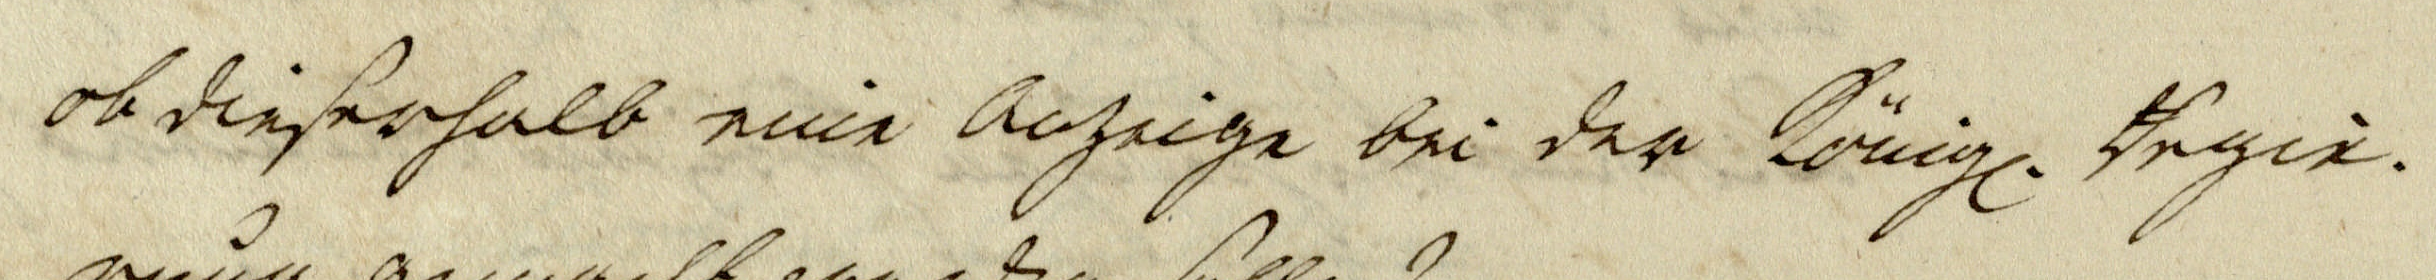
ob dieserhalb eine Anzeige bei der Königl. Regie¬
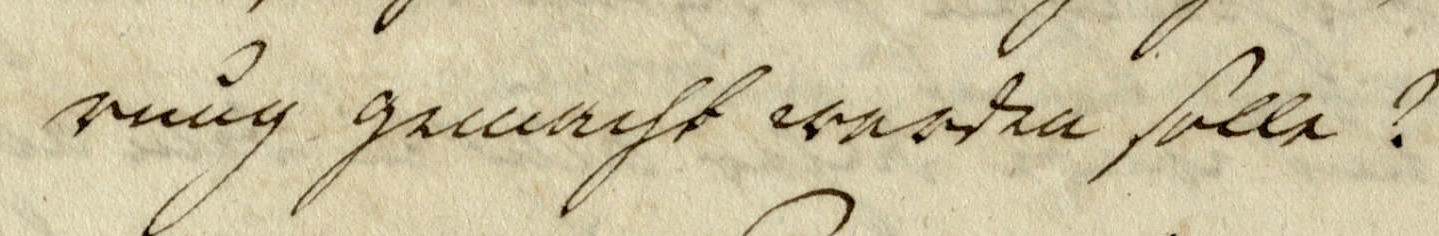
rung gemacht werden solle?
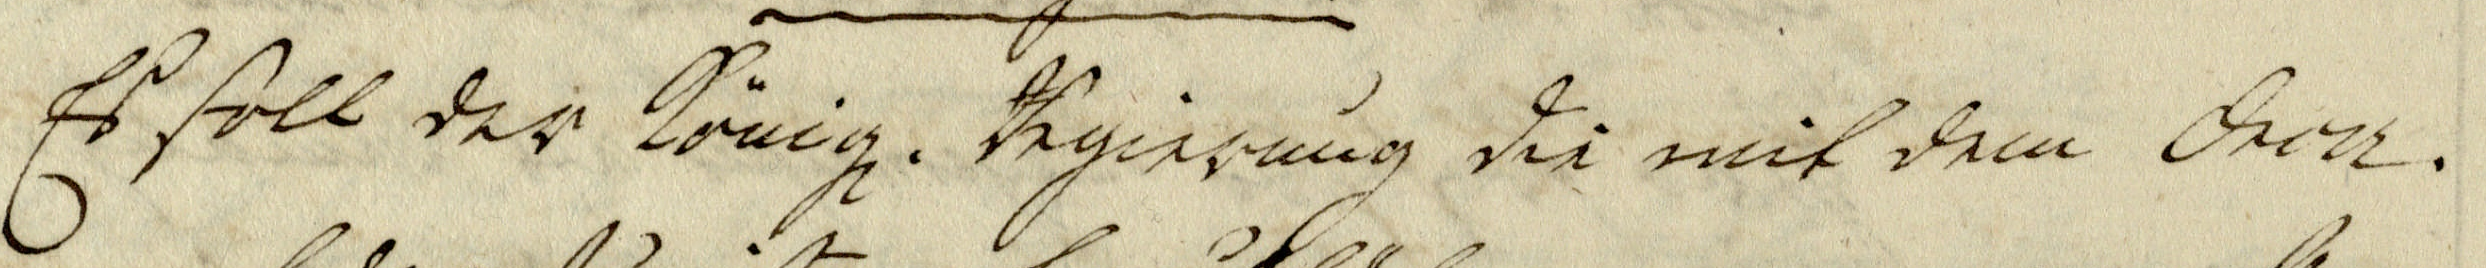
Es soll der König. Regierung die mit dem Deca¬
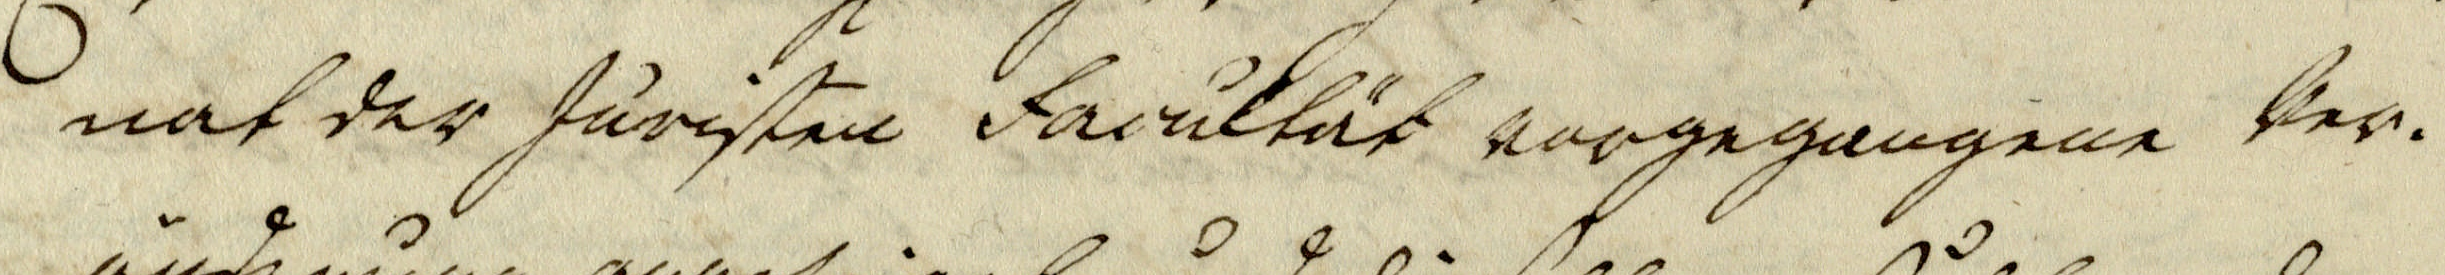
nat der Juristen Facultät vorgegangene Ver¬
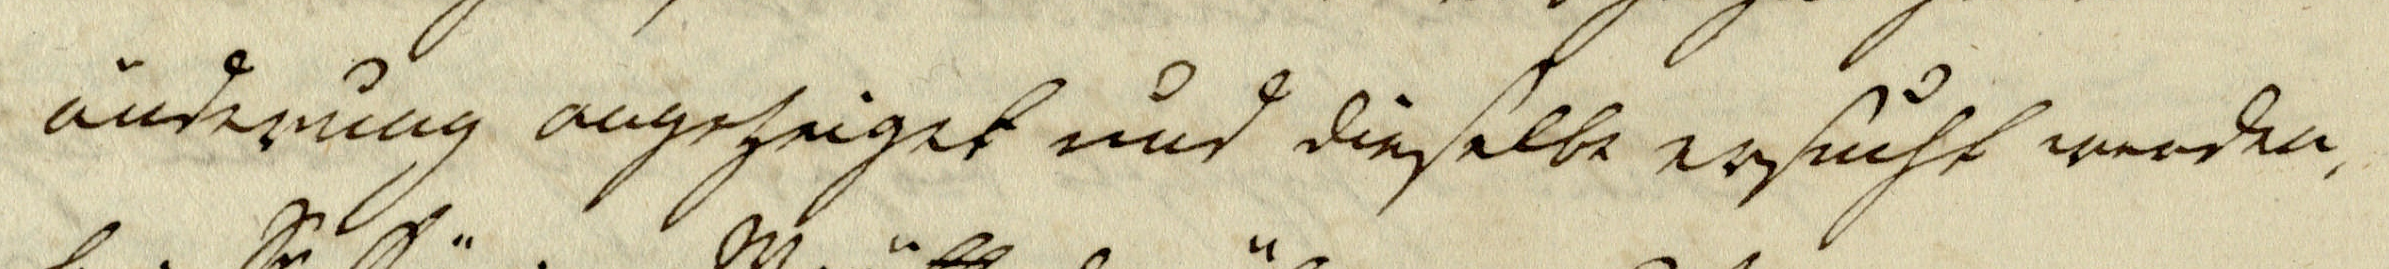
änderung angezeiget und dieselbe ersucht werden,
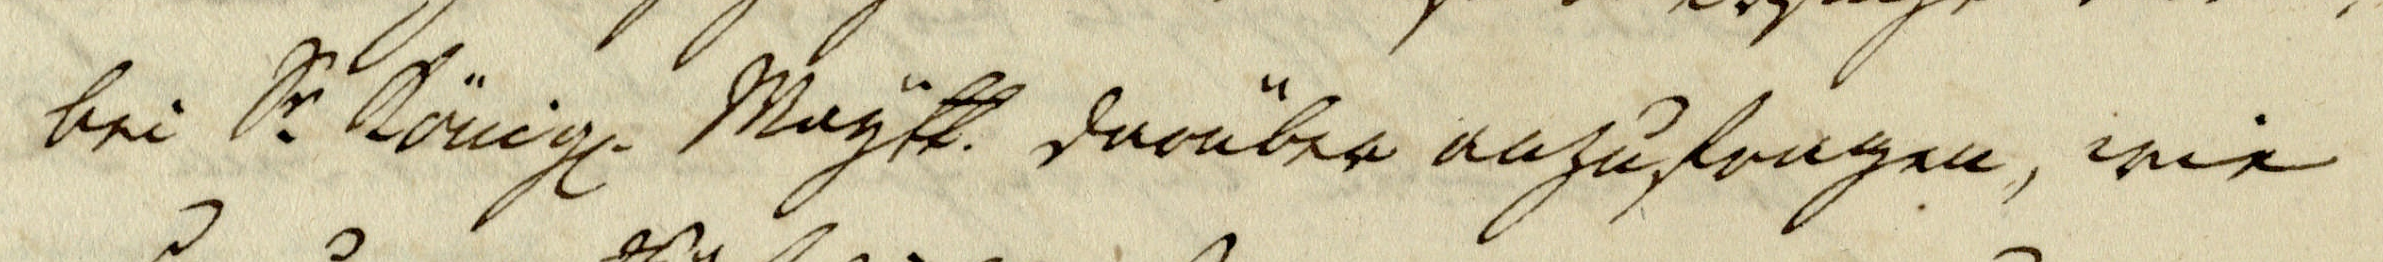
bei Sr Königl. Maÿtt. darüber anzufragen, wie
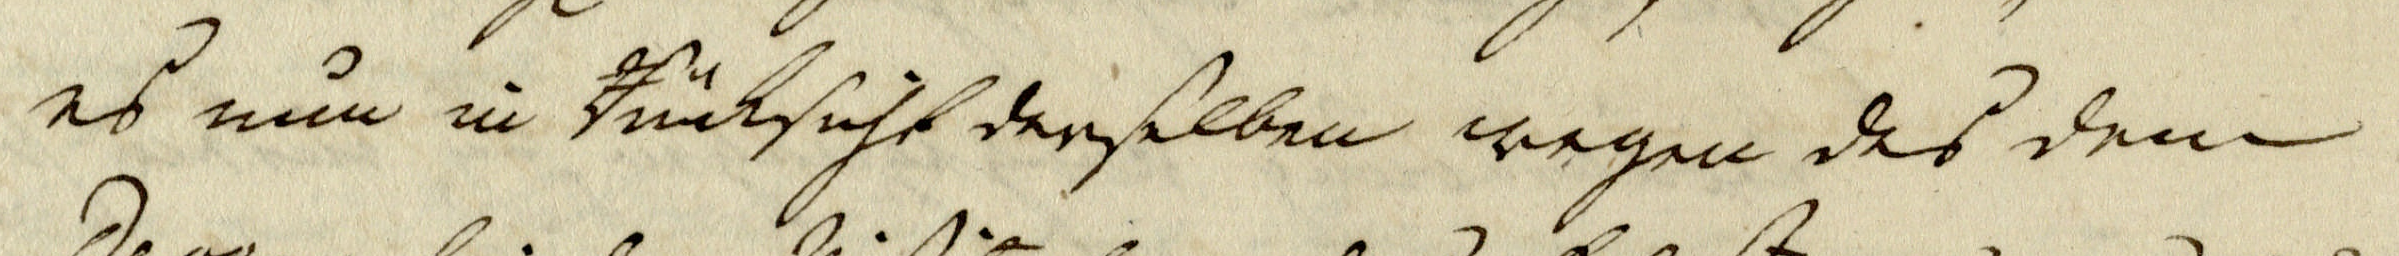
es nun in Rücksicht derselben wegen des dem
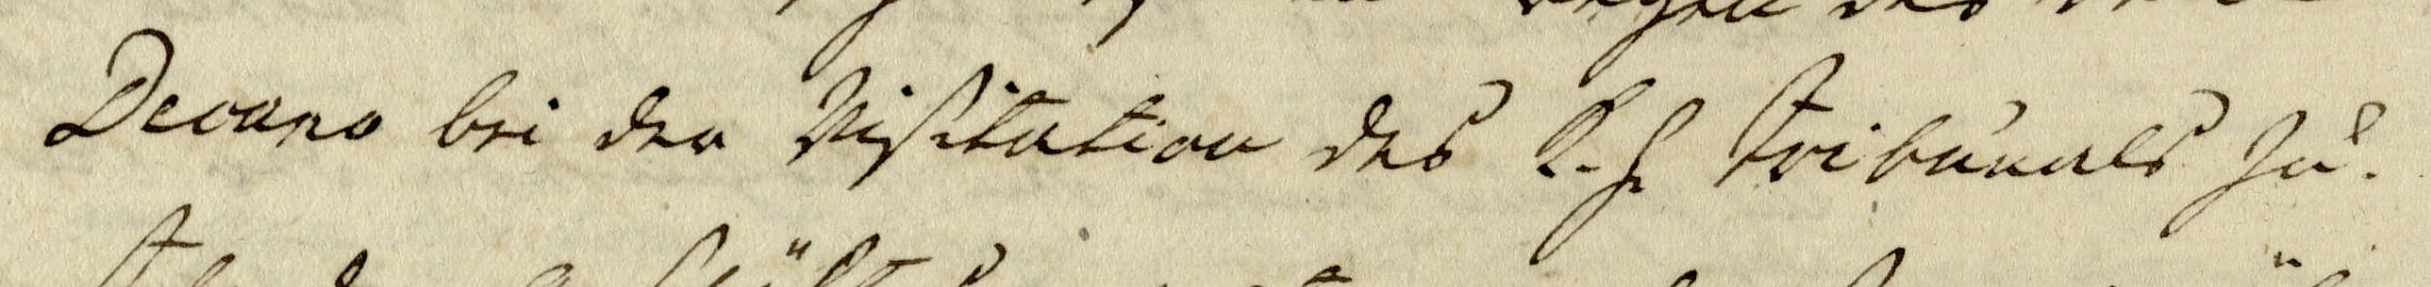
Decano bei der Visitation des K. h. Tribunals zu¬
